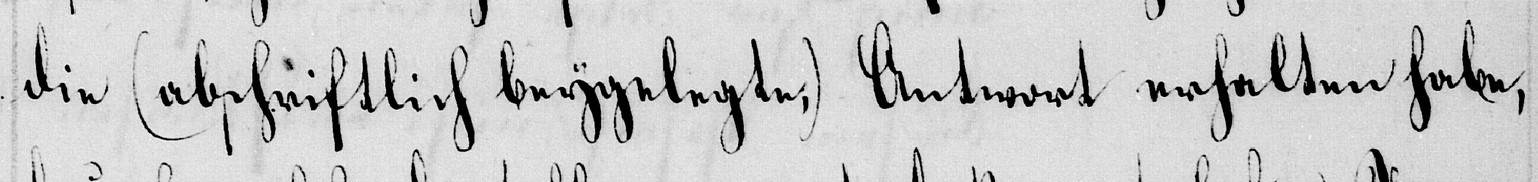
die (abschriftlich beygelegte,) Antwort erhalten habe,
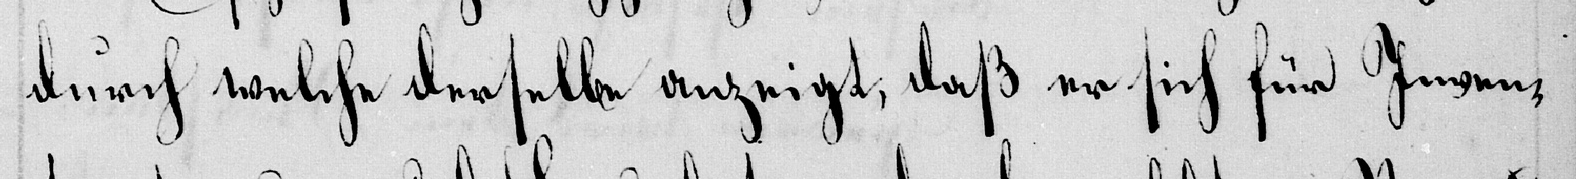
durch welche derselbe anzeigt, daß er sich für Inven¬
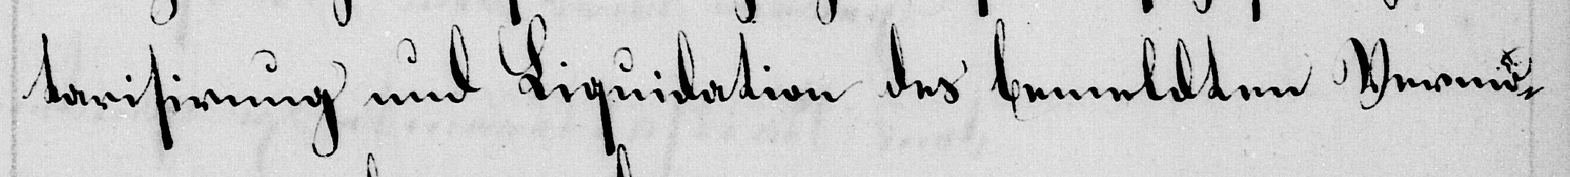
tarisirung und Liquidation des bemeldeten Vermö¬
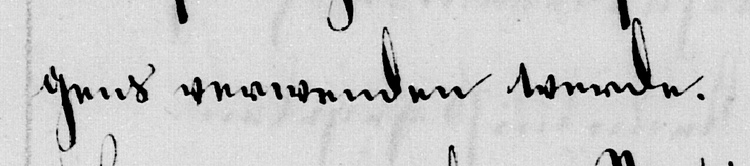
gens verwenden werde.
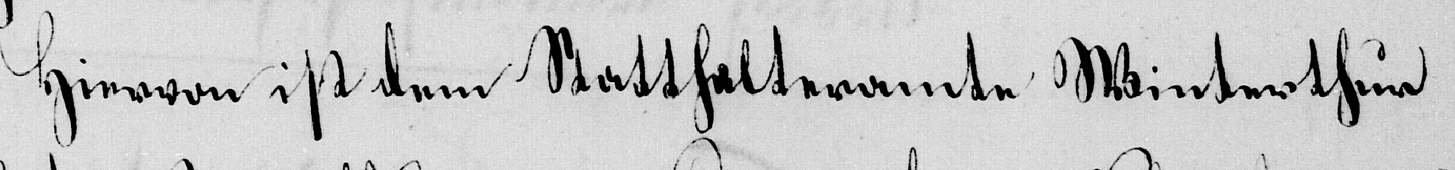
Hiervon ist dem Statthalteramte Winterthur
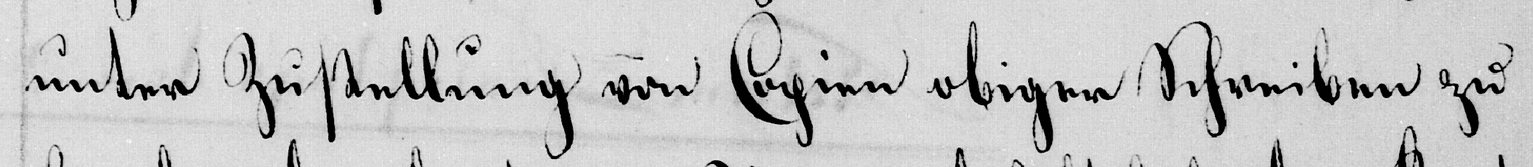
unter Zustellung von Copien obiger Schreiben zu
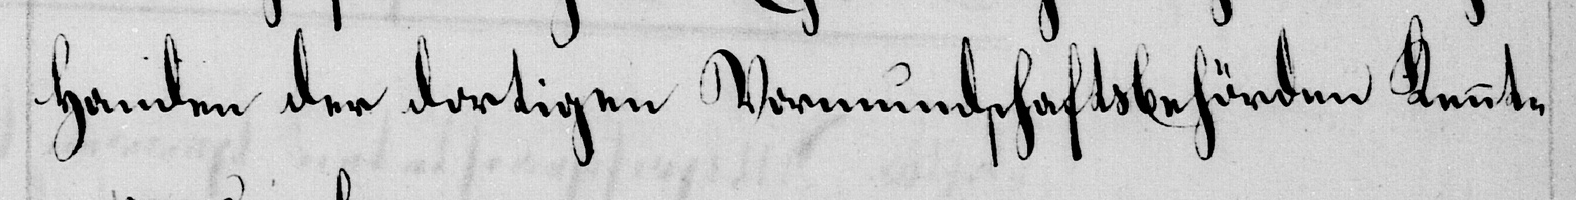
Handen der dortigen Vormundschaftsbehörde Kennt¬
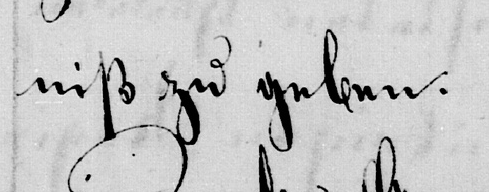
niß zu geben.
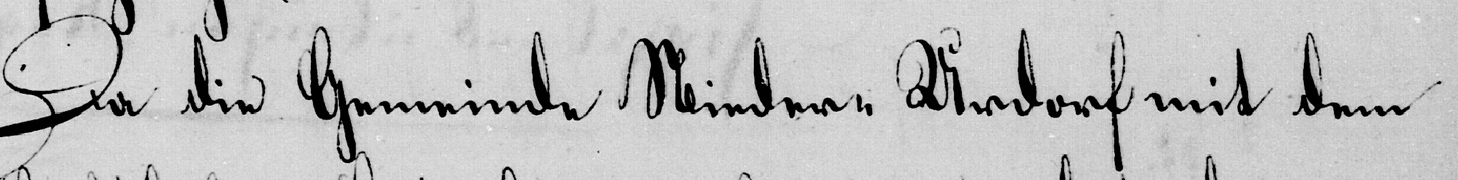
Da die Gemeinde Nieder-Urdorf mit dem
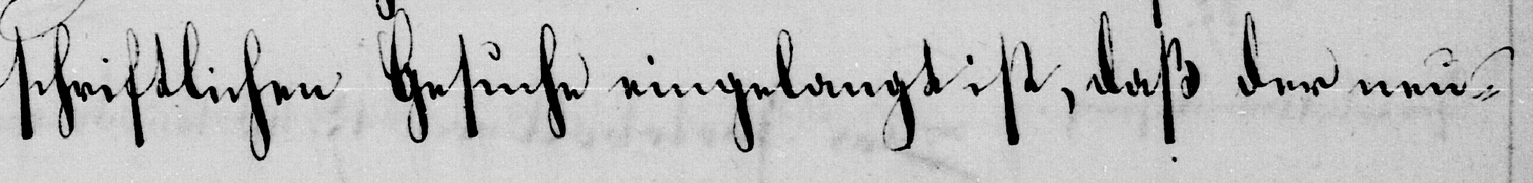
schriftlichen Gesuche eingelangt ist, daß der neu-
